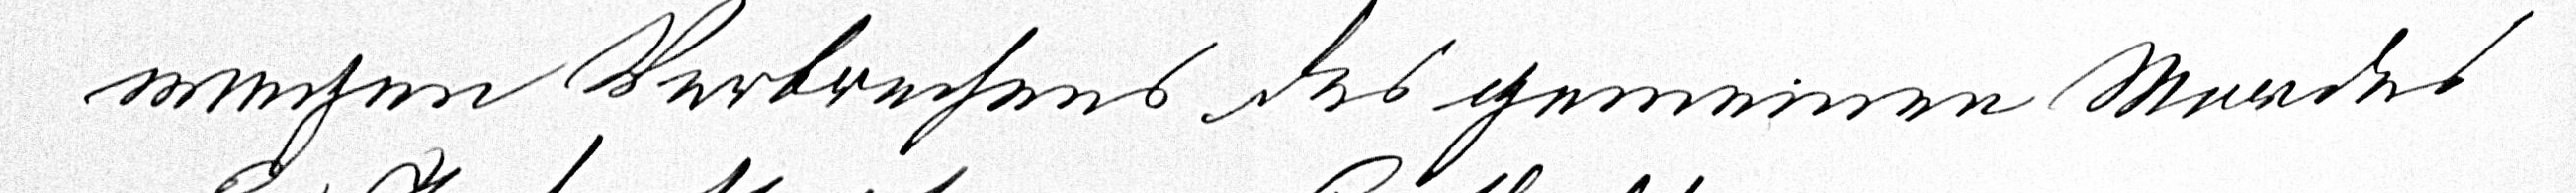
wegen Verbrechens des gemeinen Mordes
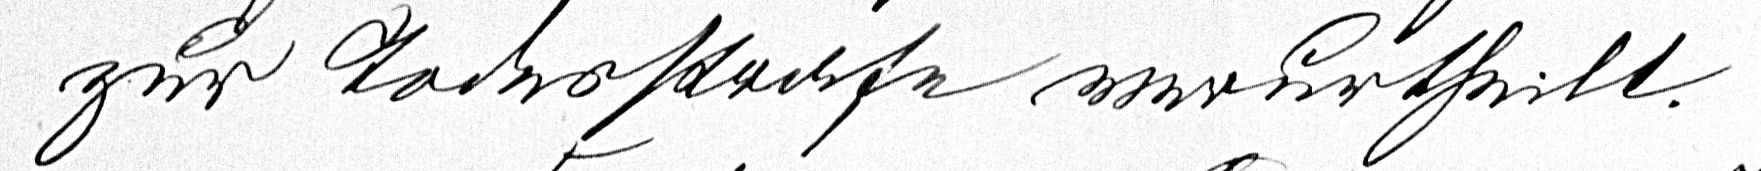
zur Todesstrafe verurtheilt.
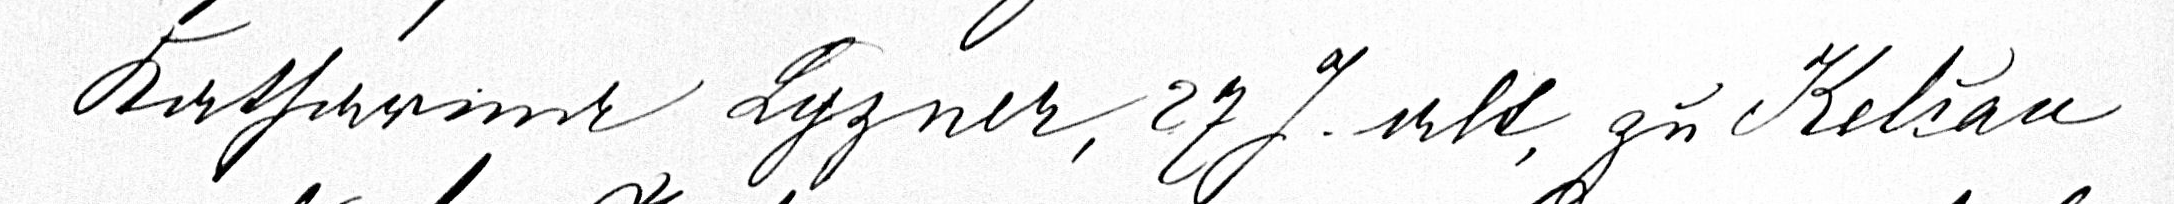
Katharina Lyzner, 27 J. alt, zu Kelcau
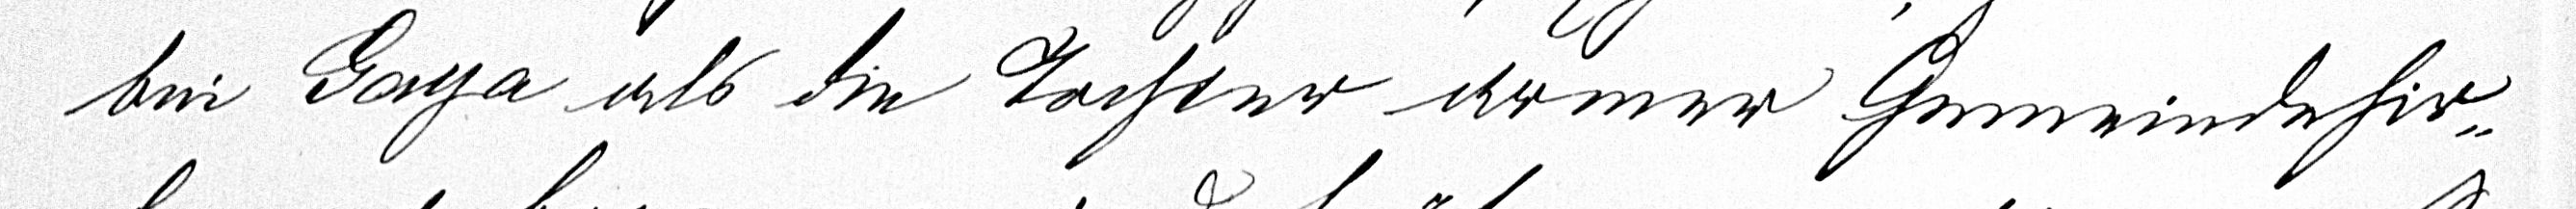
bei Gaya als die Tochter armer Gemeindehir¬
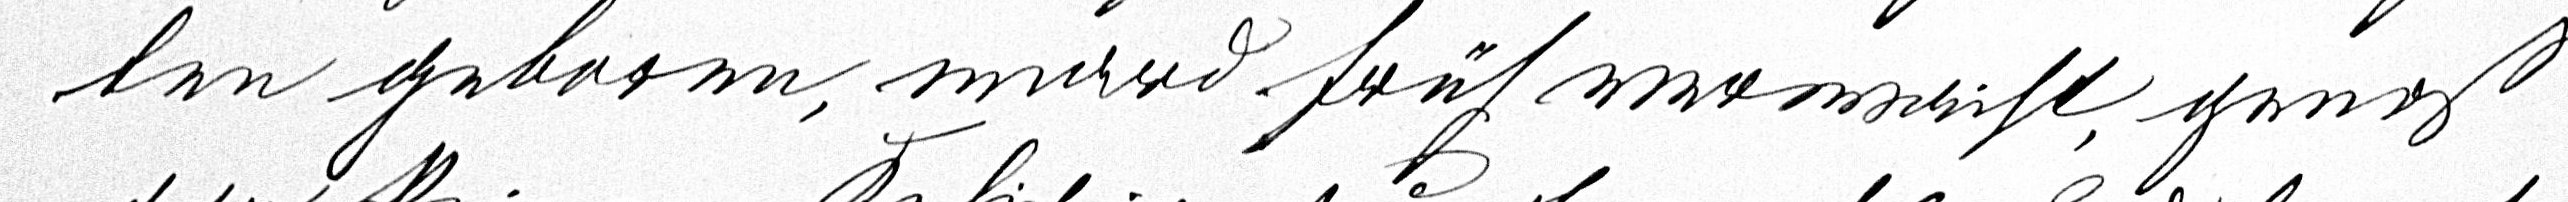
ten geboren, ward früh verwaist, genas
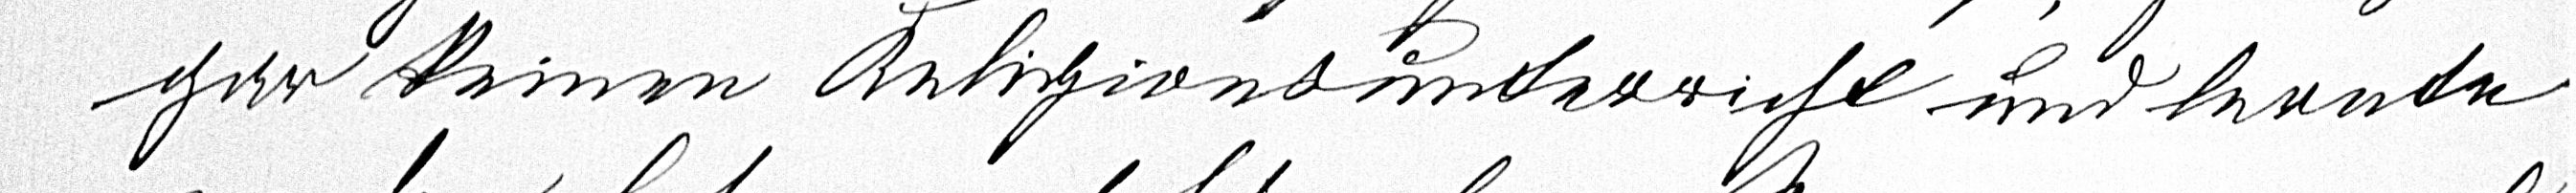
gar keinen Religionsunterricht und lernte
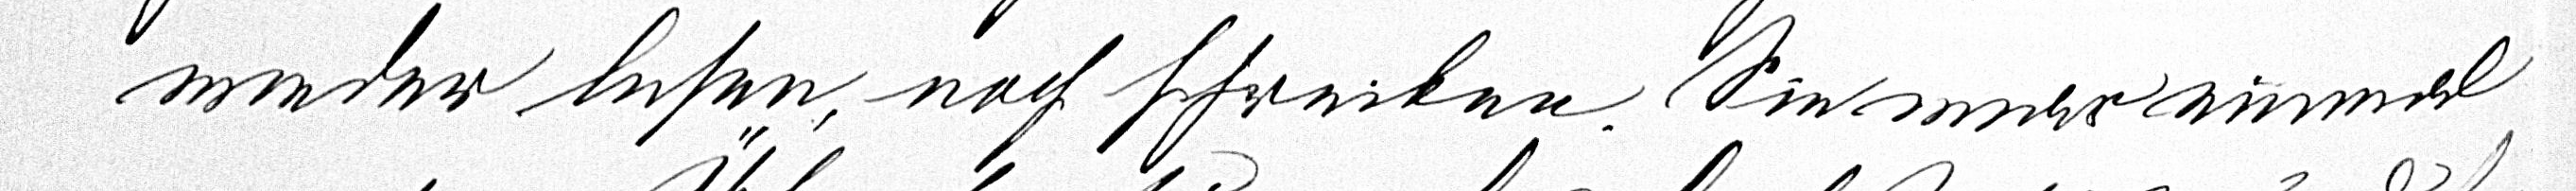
weder lesen, nach schreiten. Sie war einmal
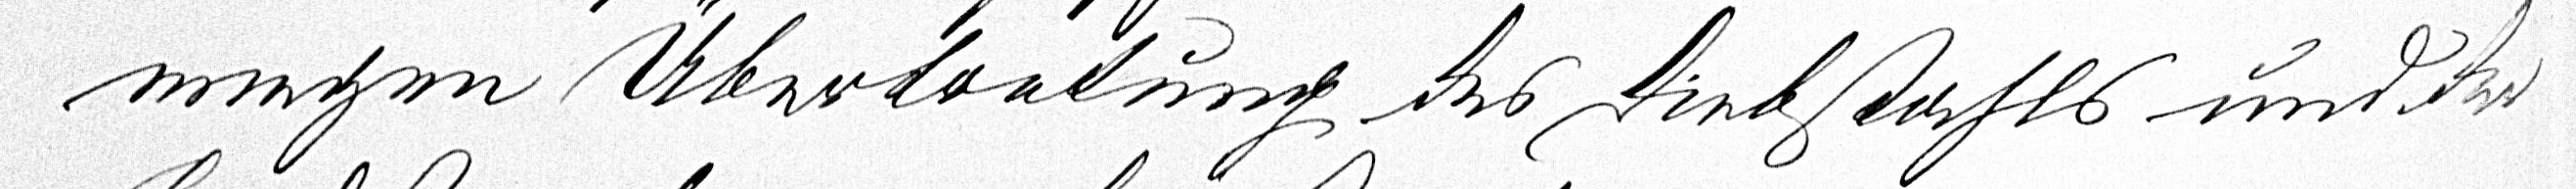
wegen Übertretung des Diebstahls und der
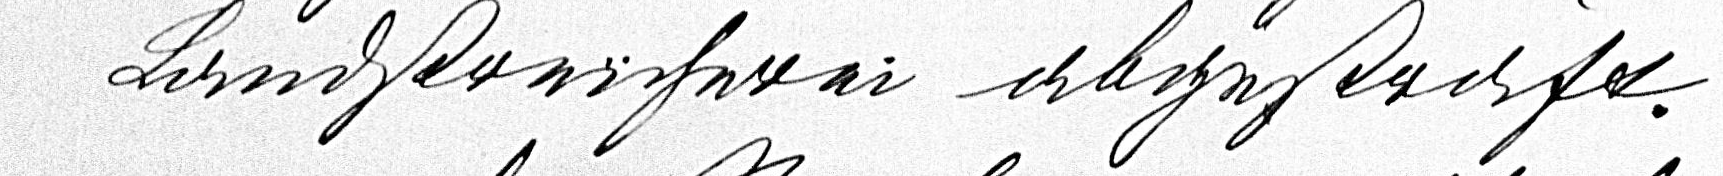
Landstreicherei abgestraft.
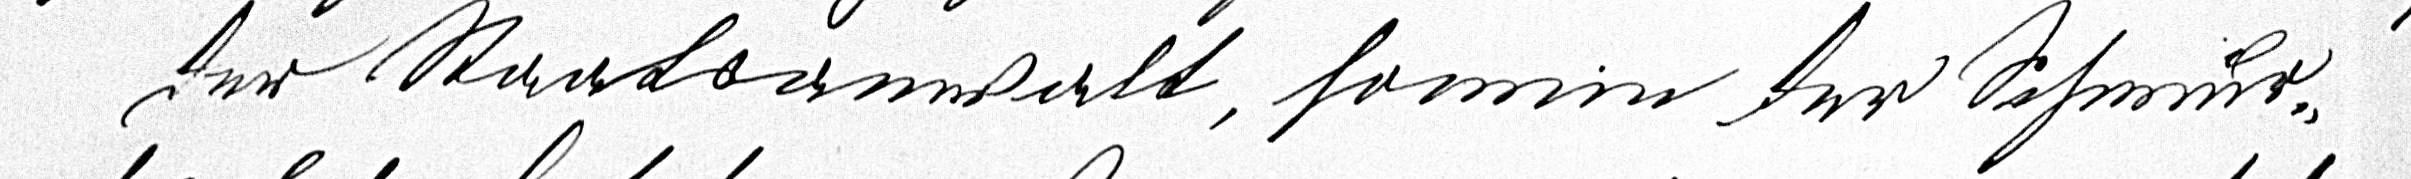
Der Staatsanwalt, sowie der Schwur¬
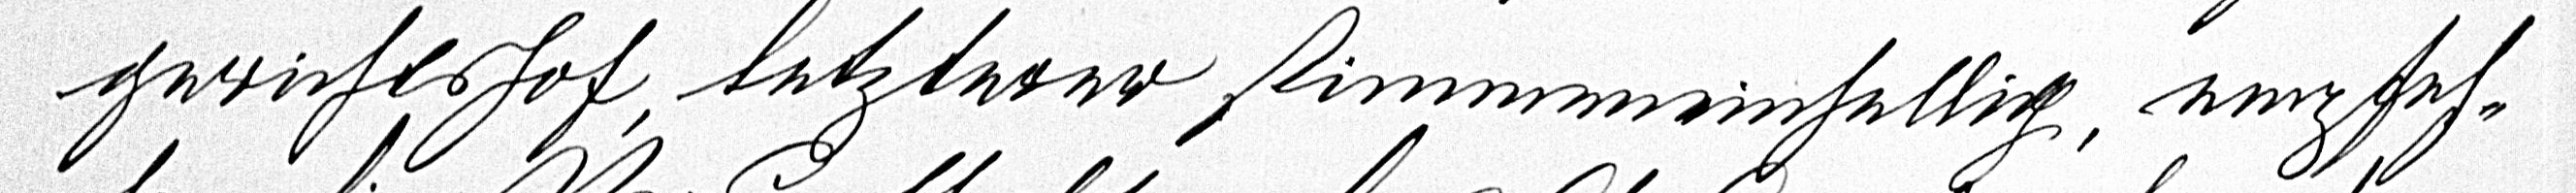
gerichtshof, letzterer stimmeinhellig, empfeh¬
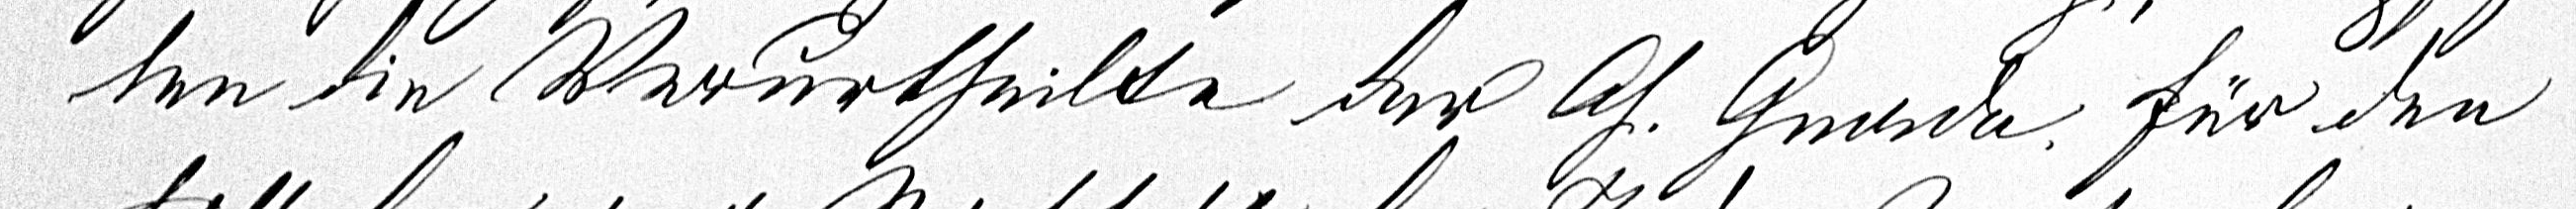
len die Verurtheilte der Ah. Gnade, für den
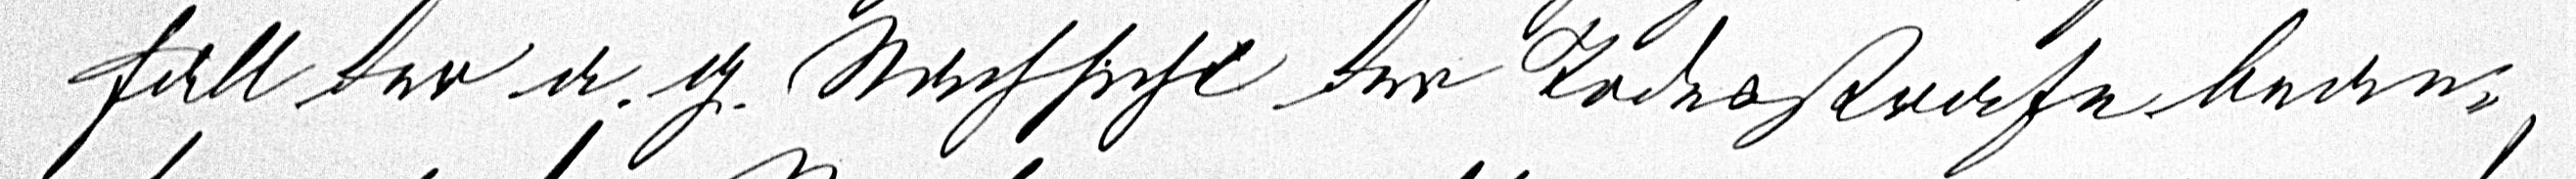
Fall der a. g. Nachsicht der Todesstrafe. bean¬
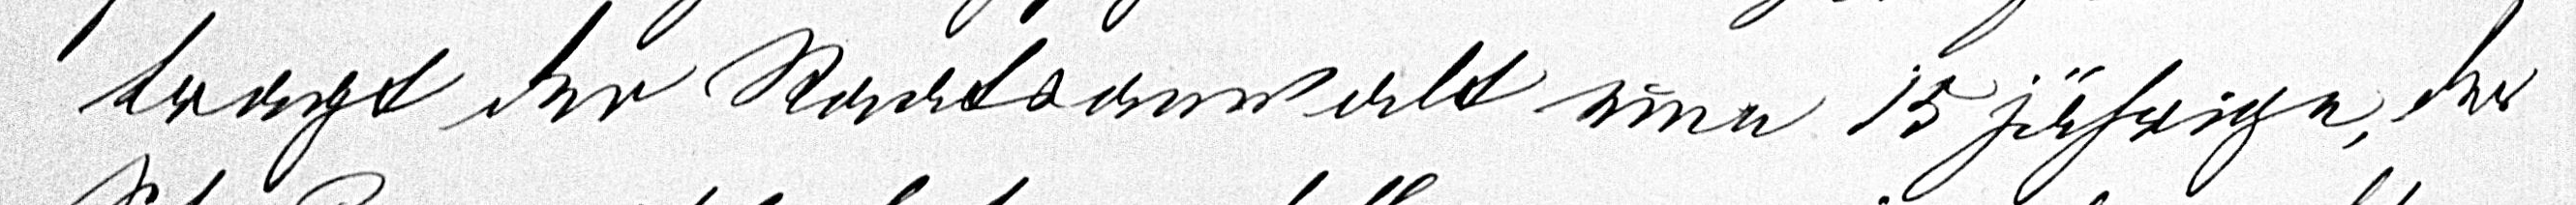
tragt der Staatsanwalt eine 15 jährige, der
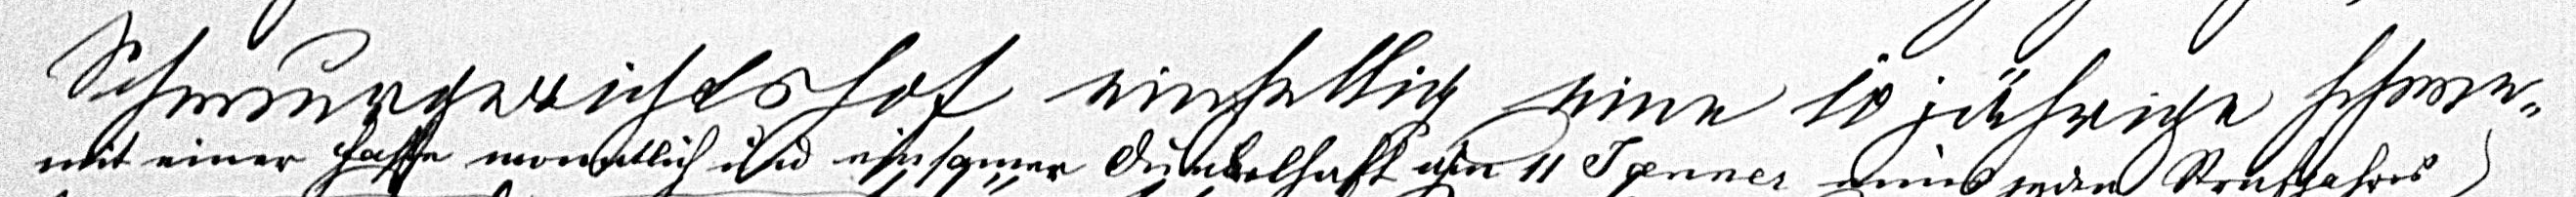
Schwurgerichtshof einhellig eine 10 jährige schwe¬
